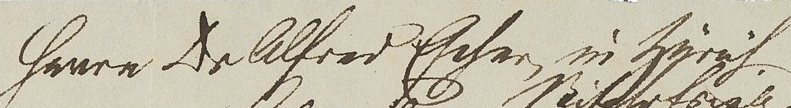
Herrn Dr Alfred Escher in Zürich
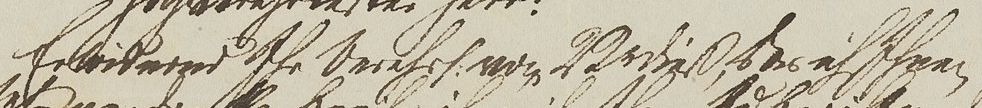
Erwidernd Ihr Verehrl: vom 22t dieß, das ich Ihnen
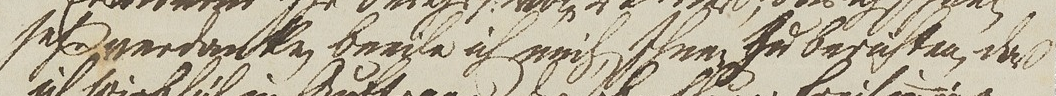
sehr verdanke, beeile ich mich, Ihnen zu berichten, daß
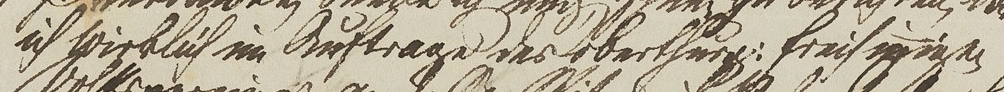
ich wirklich im Auftrage des oberthurg: freisinnigen
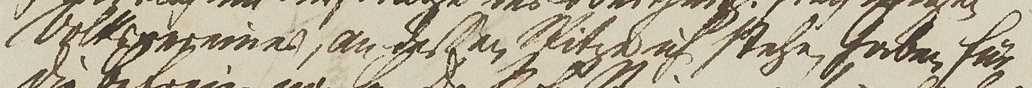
Volksvereines, an dessen Spitze ich stehe, Gaben für
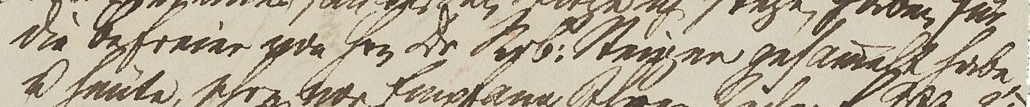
die Befreier von Hrn Dr Rob: Steiger gesammelt habe,
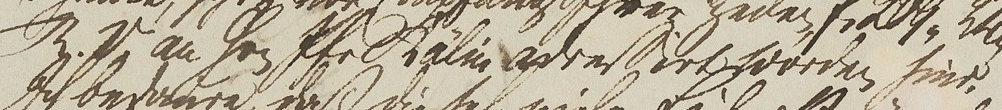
R. V. an Hrn Pfr Kälin adressirt worden sind.
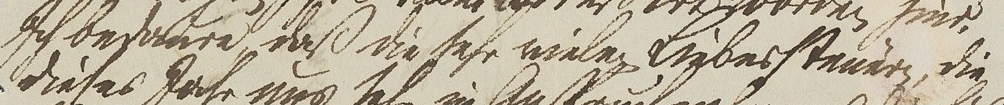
Ich bedaure, daß die sehr vielen Liebessteuern, die
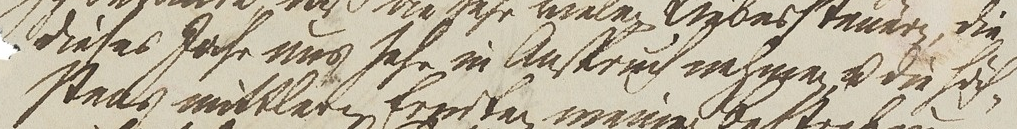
dieses Jahr uns sehr in Anspruch nehmen, & die höch-
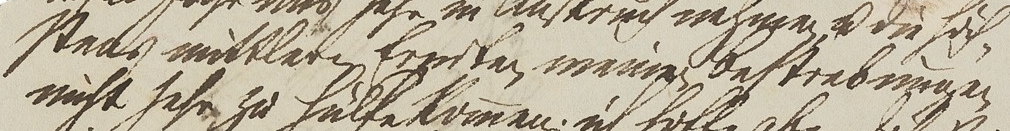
stens mittlere Erndte, meinen Bestrebungen
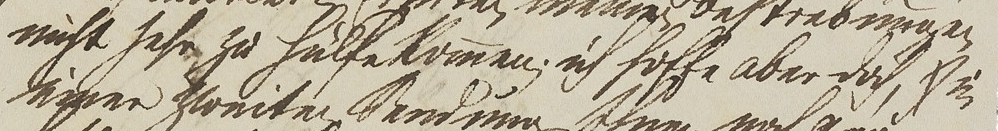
nicht sehr zu Hülfe kommen; ich hoffe aber doch, I in
